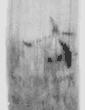{廿七}
